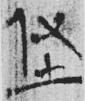坿
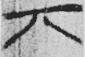亓（其）
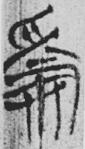○（家）
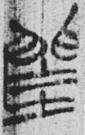閨（闚）
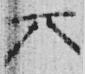亓（其）
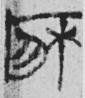○（戶）
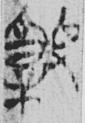○（闃）
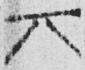亓（其）
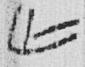亡（无）
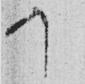人
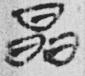晶（三）
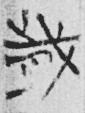歲（歲）
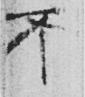不
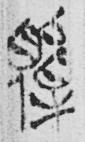覿
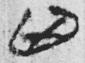凶
